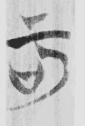可
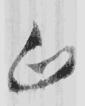㠯（以）
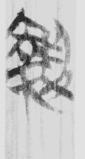執
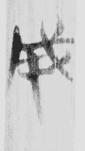成
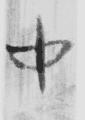中
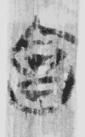合
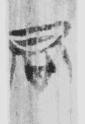君
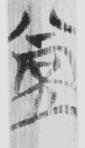當
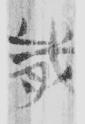歲
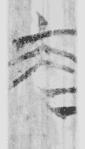夫=
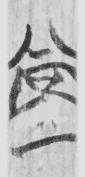當
